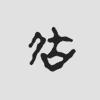居
